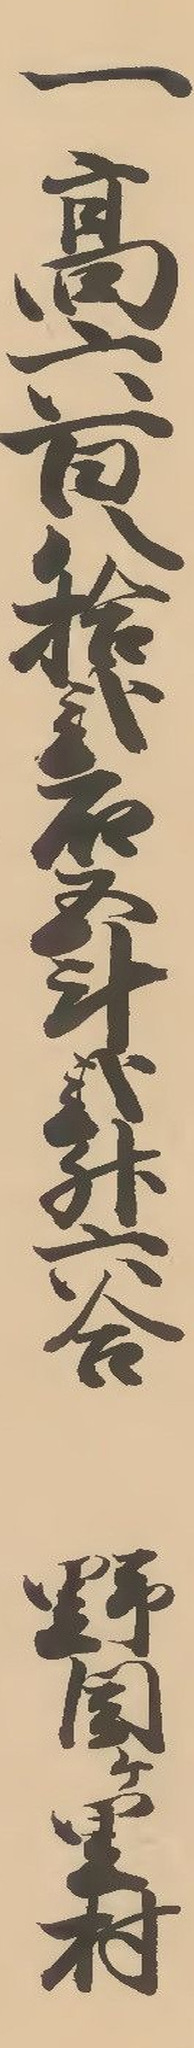一髙六百八拾弐石五斗弐升六合野目ケ里村
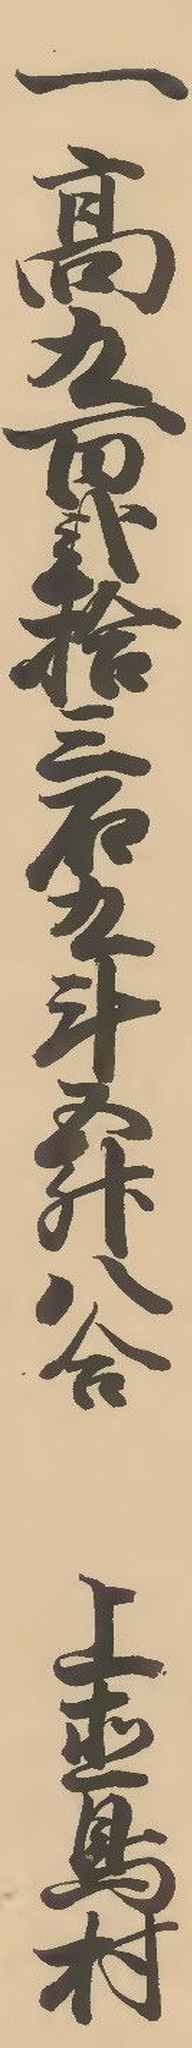一髙九百弐拾三石九斗五升八合上直鳥村
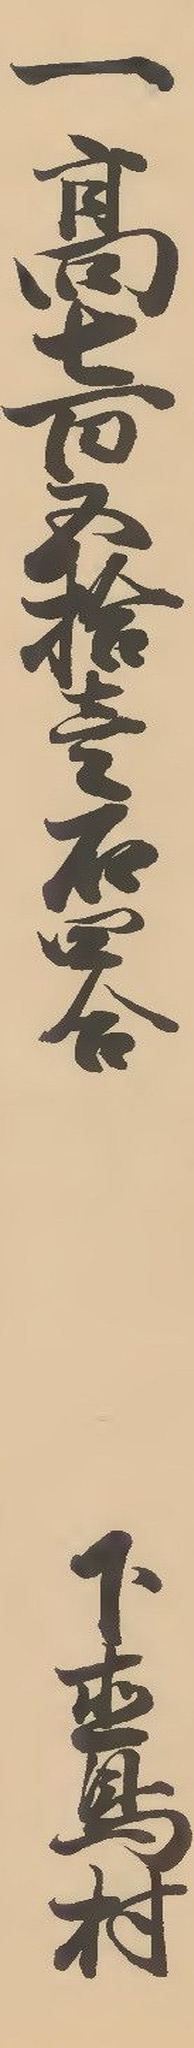一髙七百五拾壱石四合下直鳥村
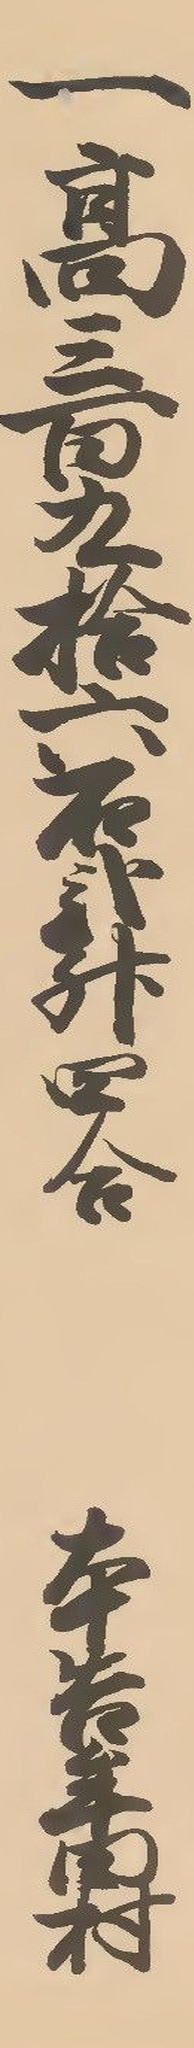一髙三百九拾六石弐升四合本吉牟田村
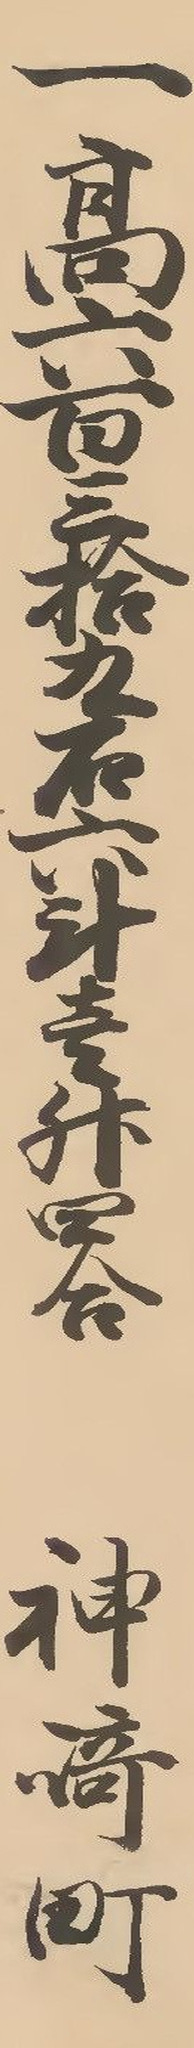一髙六百三拾九石六斗壱升四合神崎町
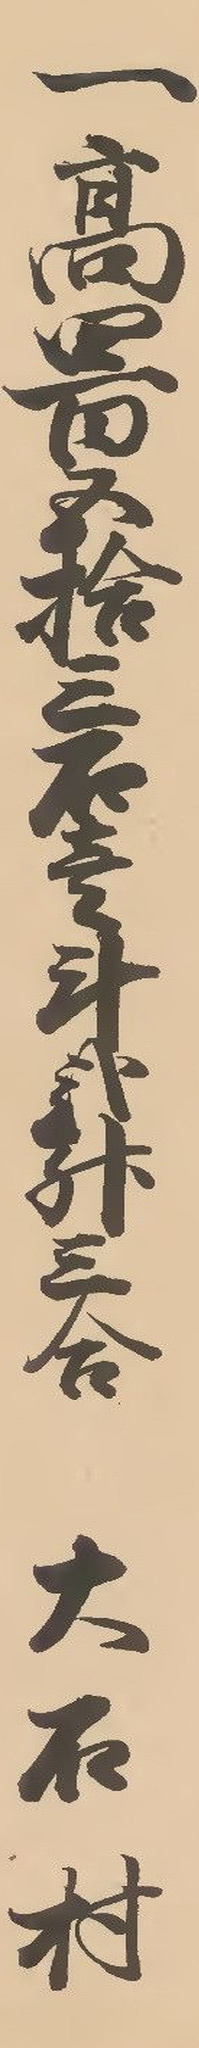一髙四百五拾三石壱斗弐升三合大石村
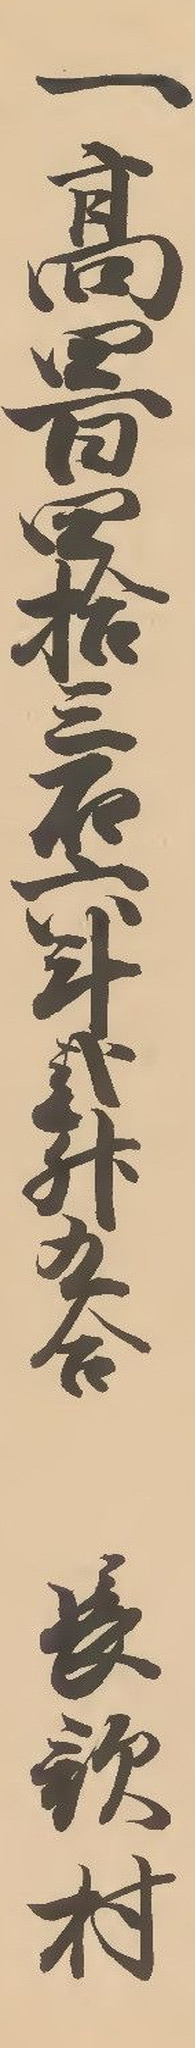一髙四百四拾三石六斗弐升九合長歌村

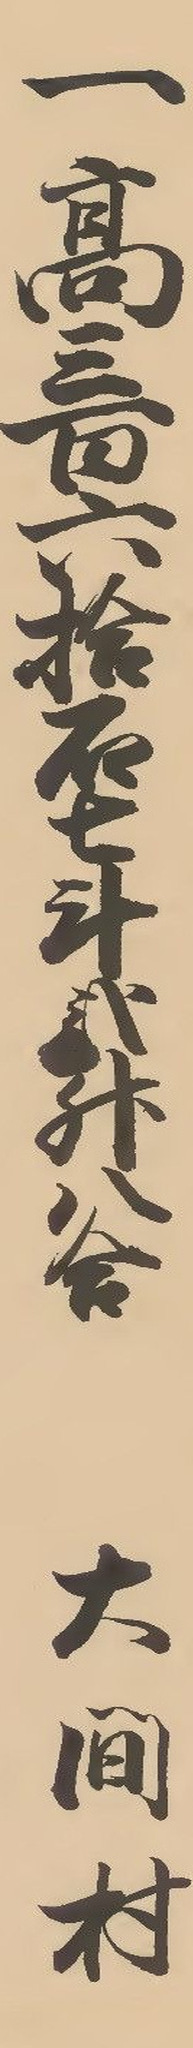一髙三百六拾石七斗弐升八合大間村
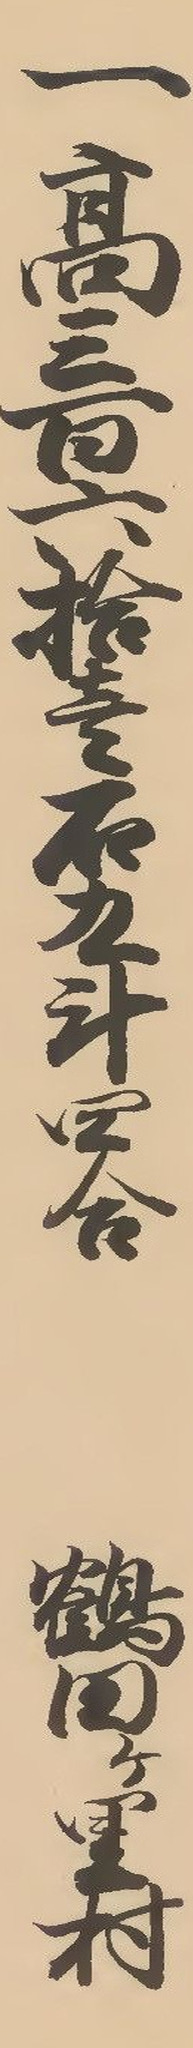一髙三百六拾壱石九斗四合鶴田ケ里村
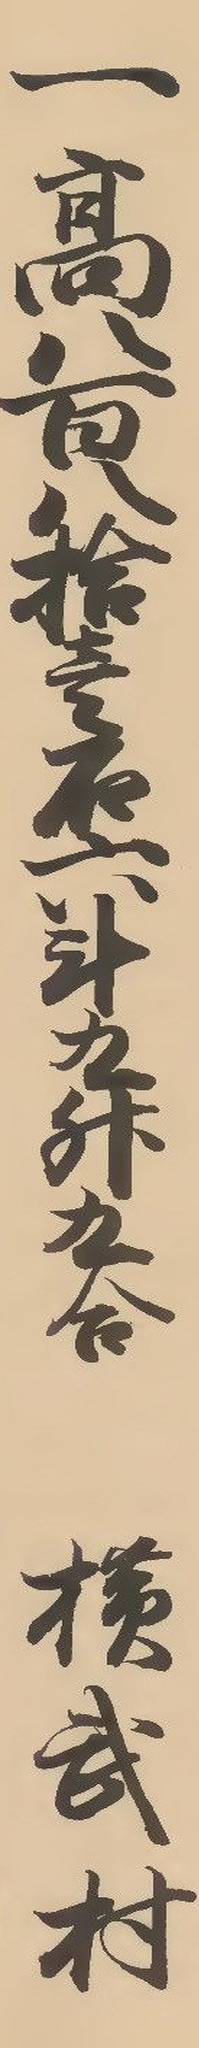一髙八百八拾壱石六斗九升九合横武村
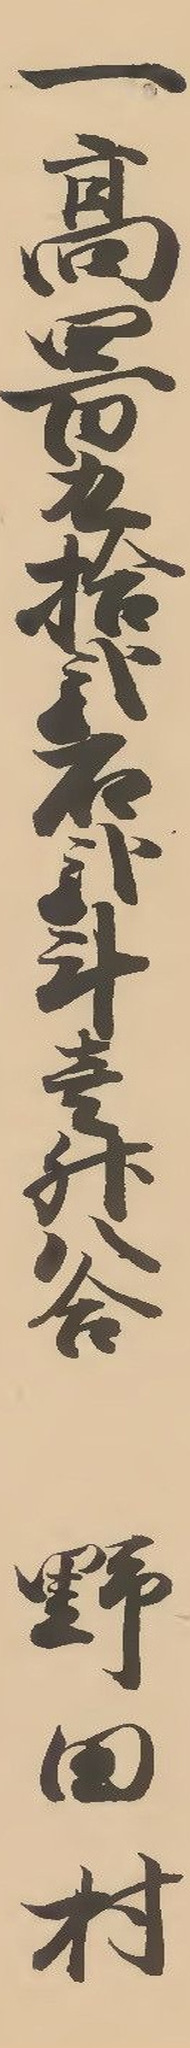一髙四百九拾弐石弐斗壱升八合野田村
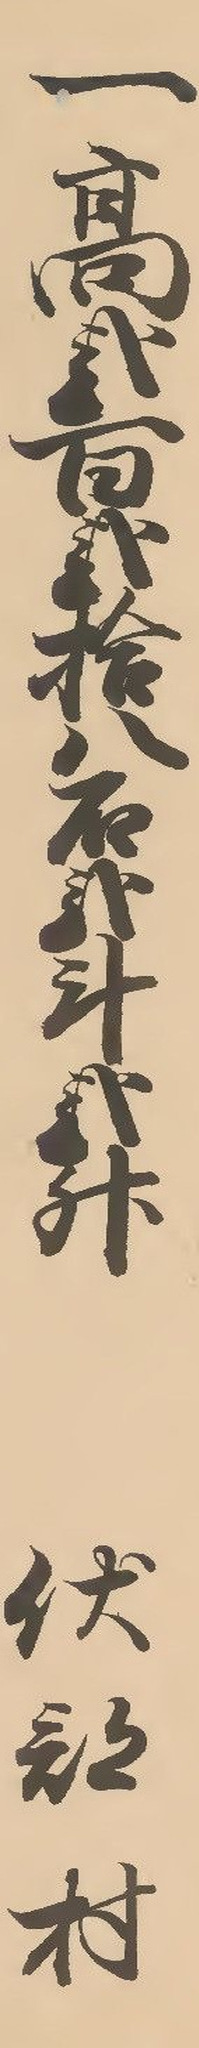一髙弐百弐拾八石弐斗弐升伏部村
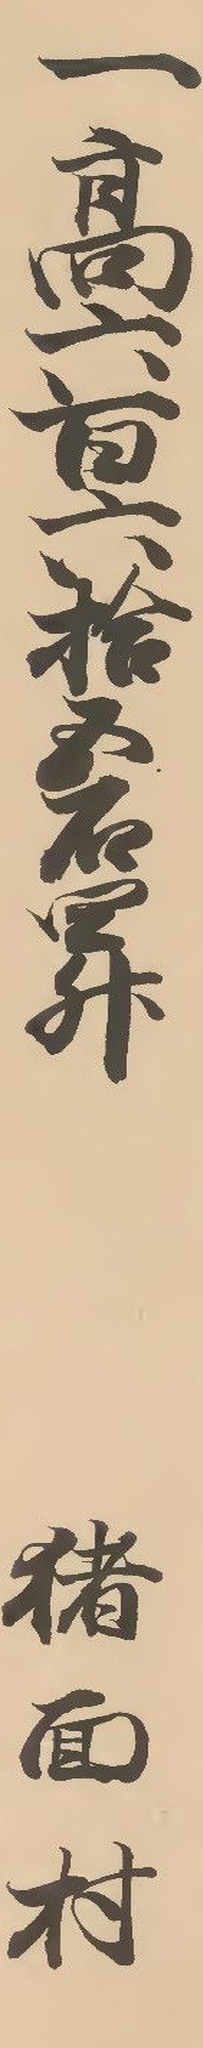一髙六百六拾五石四升猪面村
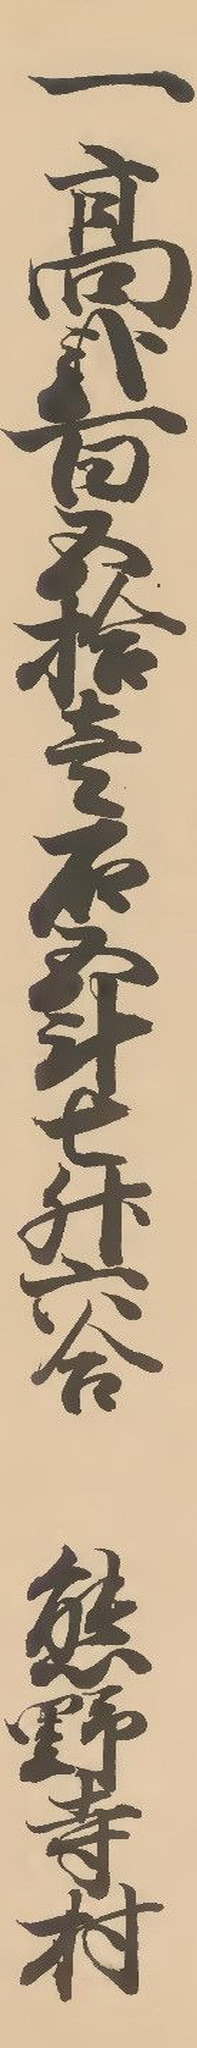一髙弐百五拾壱石五斗七升六合熊野寺村
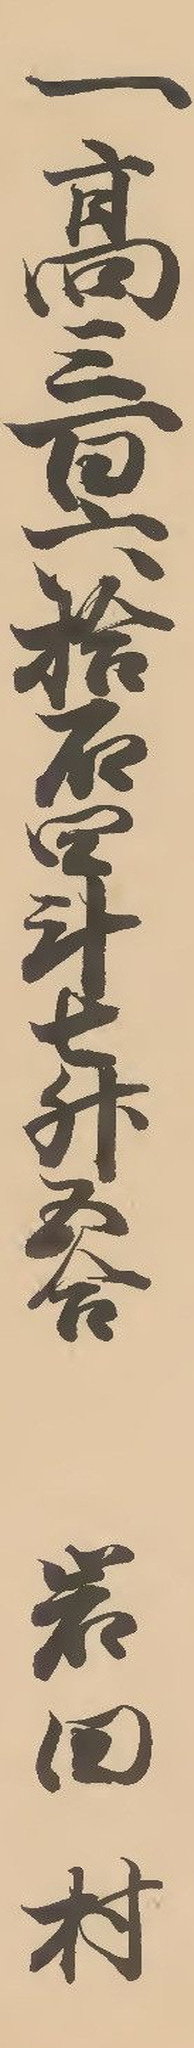一髙三百六拾石四斗七升五合岩田村

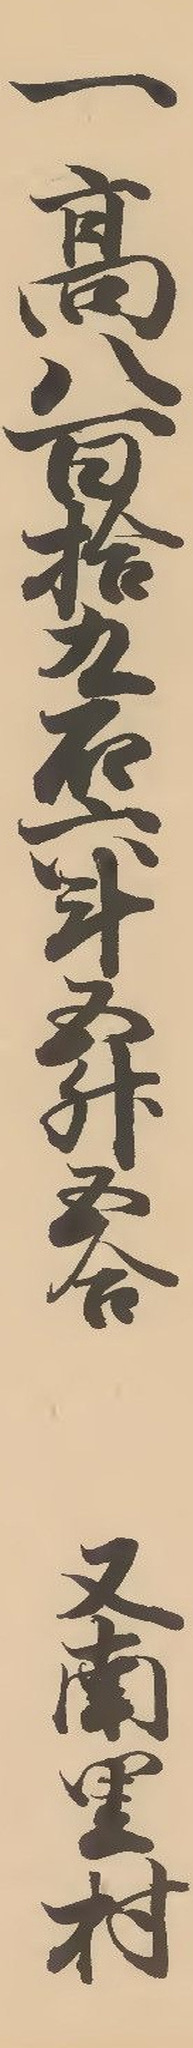一髙八百拾九石六斗五升五合又南里村
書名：肥前国郷帳
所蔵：国立公文書館 National Archives of Japan
